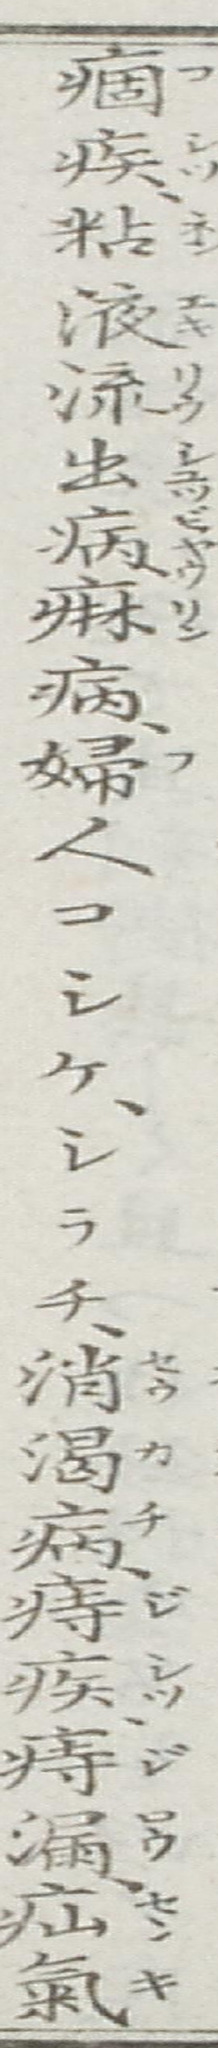痼疾、粘液漢字流失病淋病、婦人コシケ、シラチ、消渇病、痔疾、痔漏、疝気
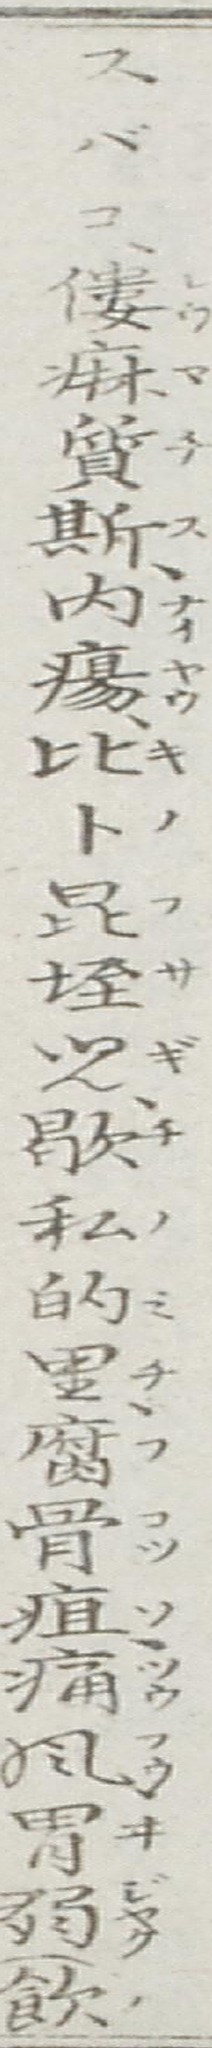スバコ、僂麻質瓦斯、内瘍、比卜昆垤児、歇私的里、腐骨痛、痛風、胃弱
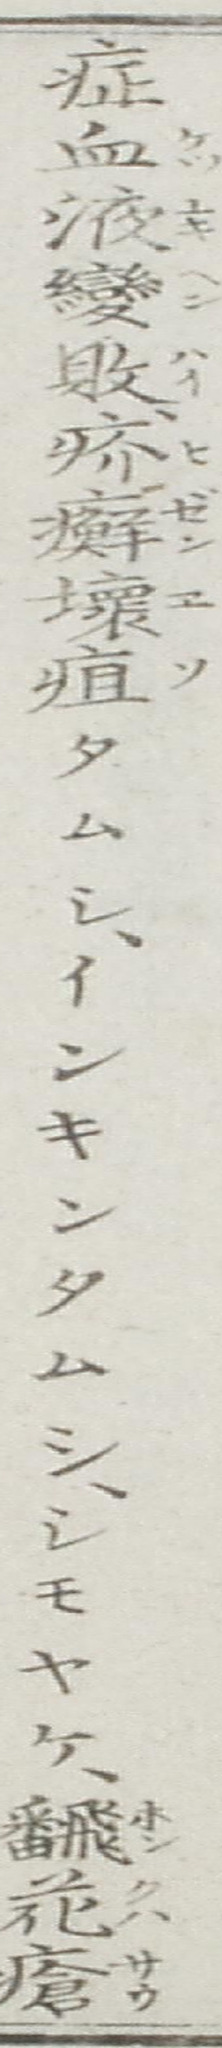症血液変敗、疥癬壊疽タムシ、インキンタムシ、シモヤケ、飜花瘡
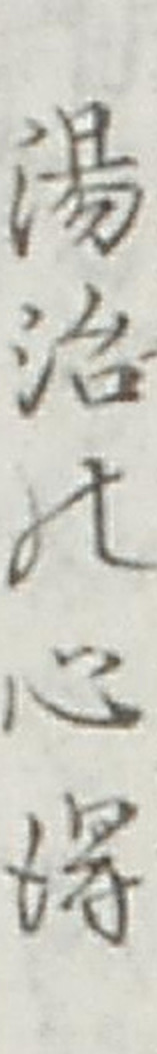湯治の心得
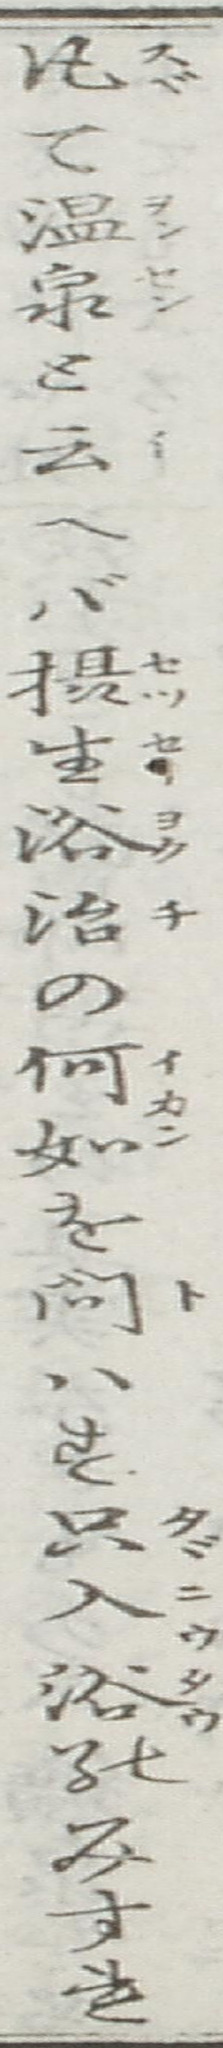凡て温泉と云へば摂生浴治の如何を問はす只入浴のみすれ
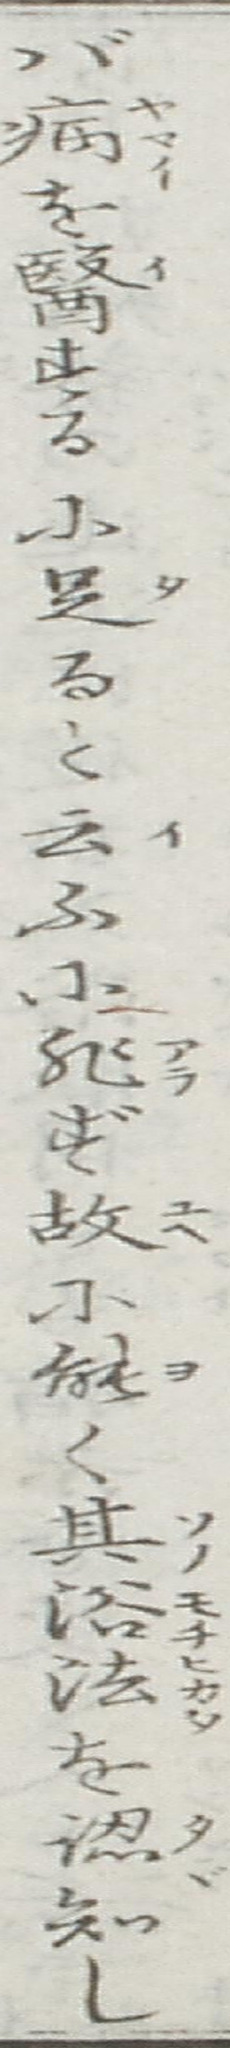ば病を医するに足ると云ふに非ず故に能く其浴法を認知し
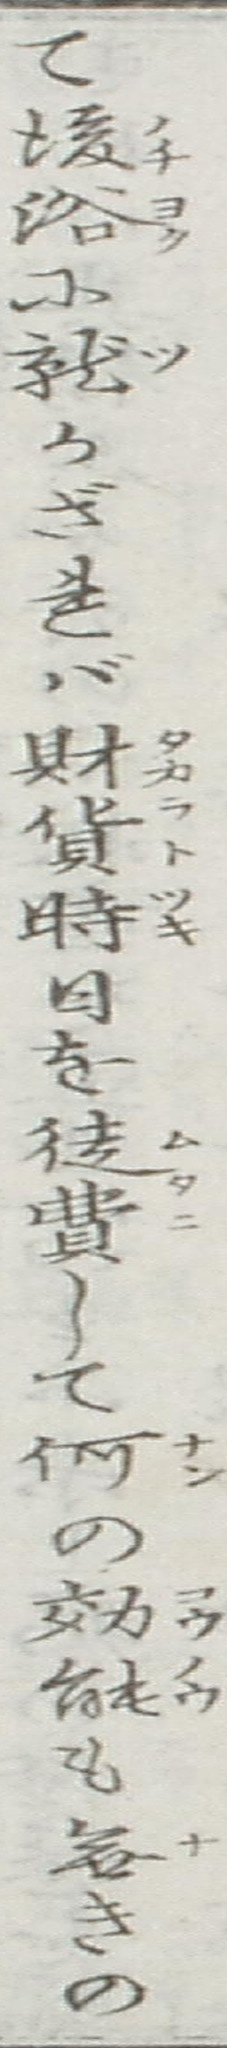て後浴に就かざれば財貨時日を徒費して何の効能も無きの
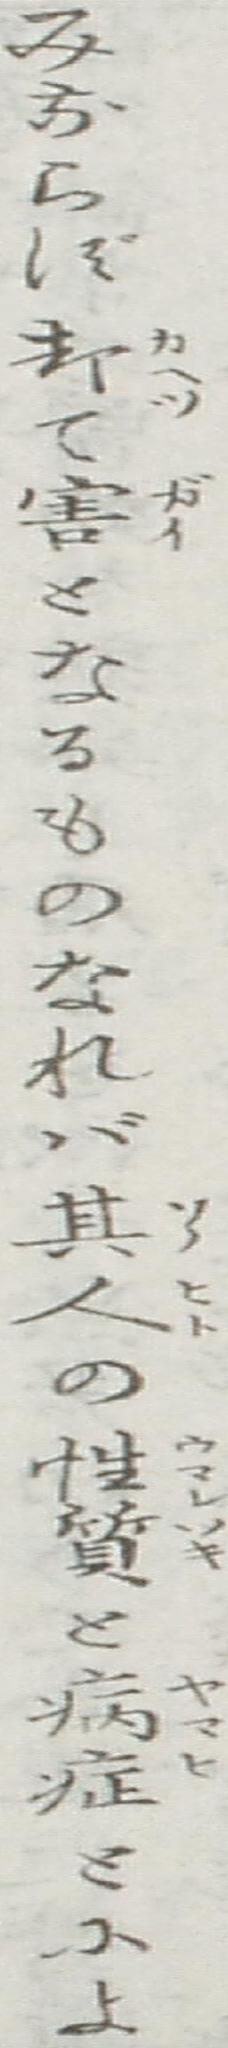みならず却て害となるものなれば其人の性質と病症とによ
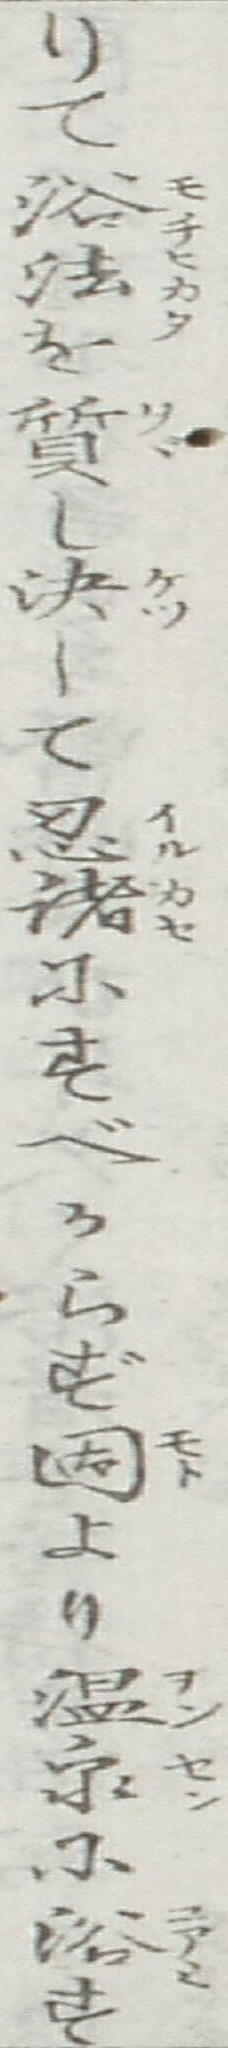りて浴法を質し決して忍諸なすべからず固より温泉に浴す
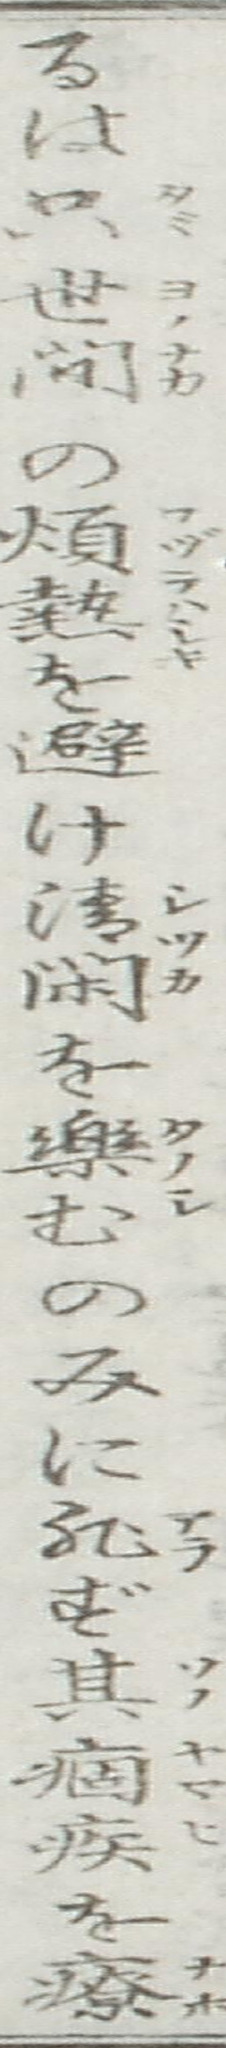るは只世間の煩熱を避け静閑を楽むのみに非ず其痼疾を療
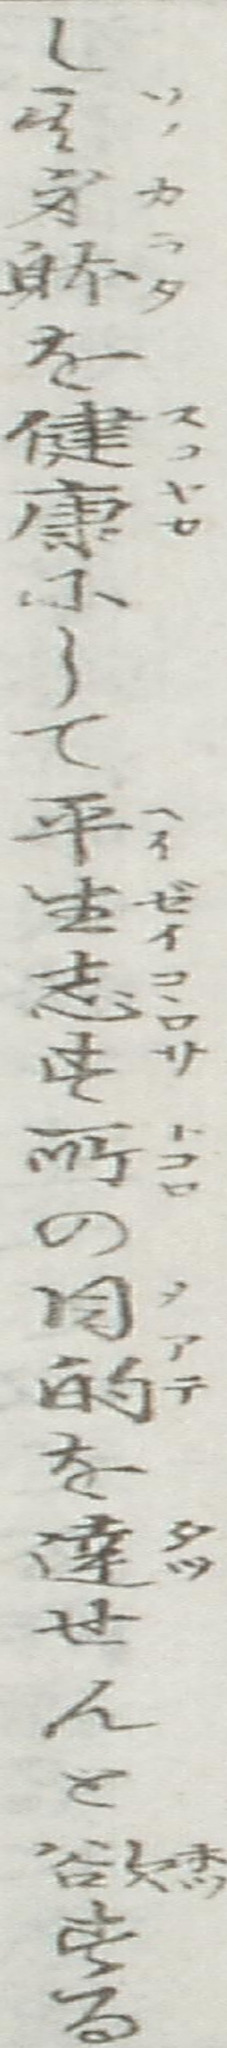し其身躰を健康にして平生志す所の目的を達せんと欲する
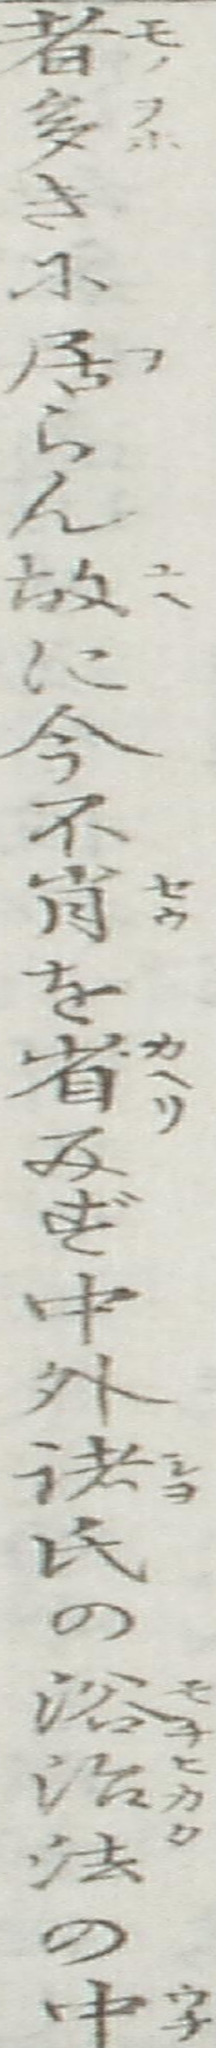者多きに居らん故に今不肖を省みず中外諸氏の浴治法の中

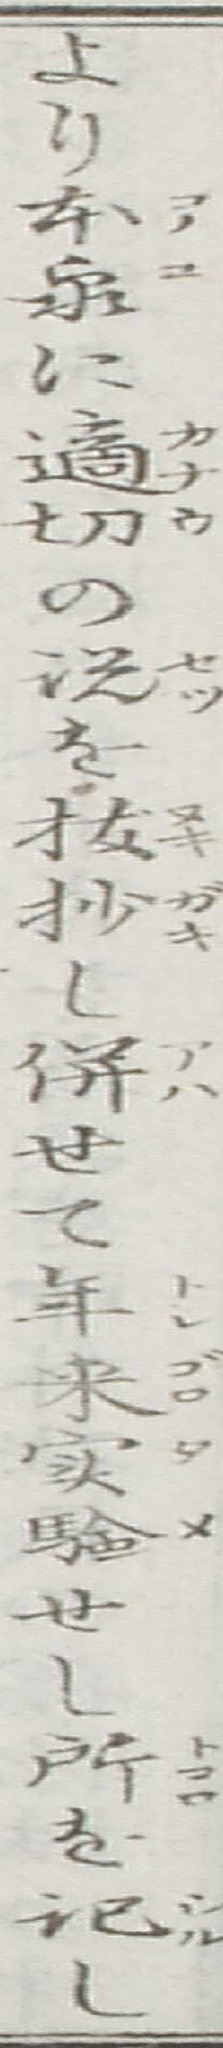より本泉に適切の説を抜抄し併せて年来実験せし所を記し
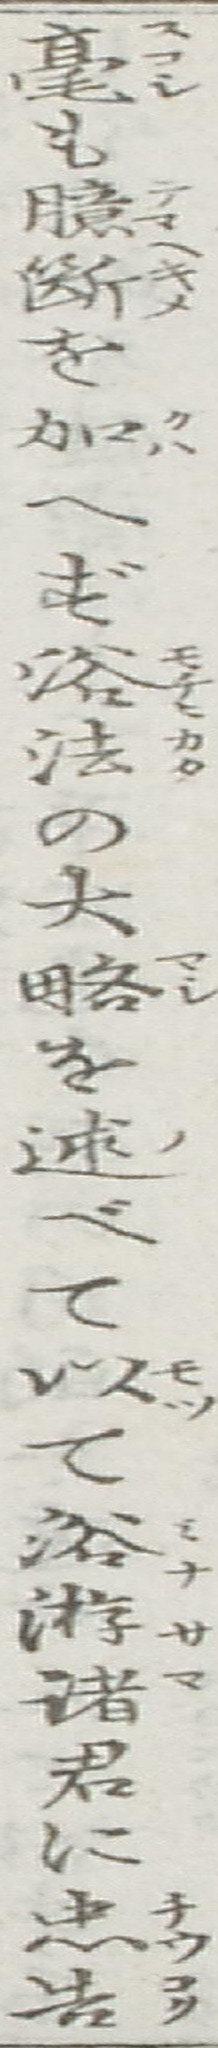毫も臆断を加へず浴法の大略を述べて以て浴遊諸君に忠告
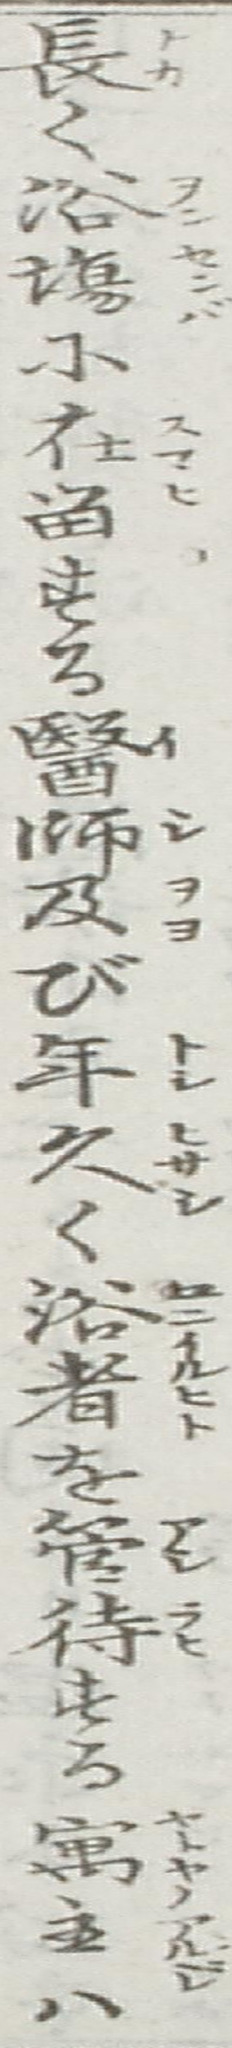長く浴場に在留する医師及び年久く浴者を歓待する寓主は
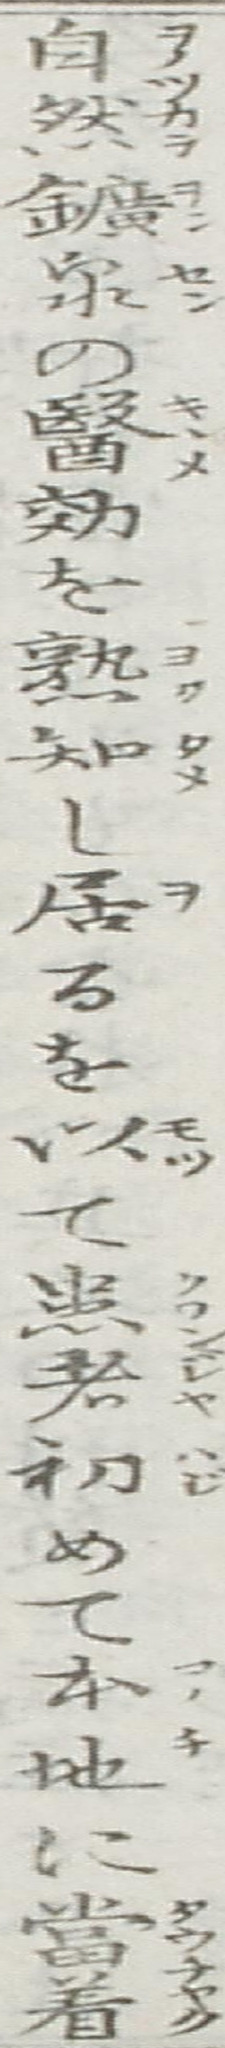自然鉱泉の医効を熟知し居るを以て患者初めて本地に到着
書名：草津温泉誌　全
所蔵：東京大学地震研究所図書室 Earthquake Research Institute Library, The University of Tokyo, JAPAN
